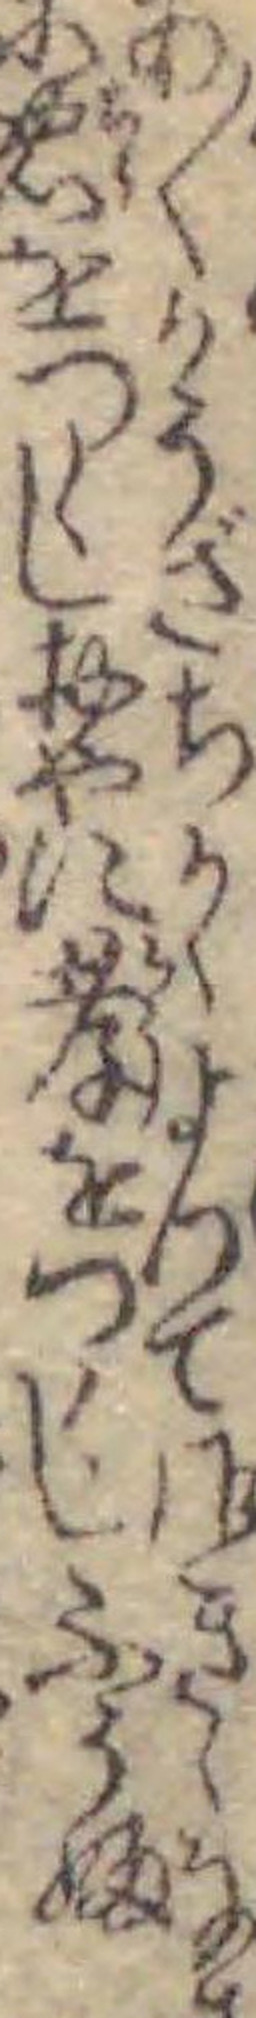君に忠をつくしおやに孝をつくしふうふ
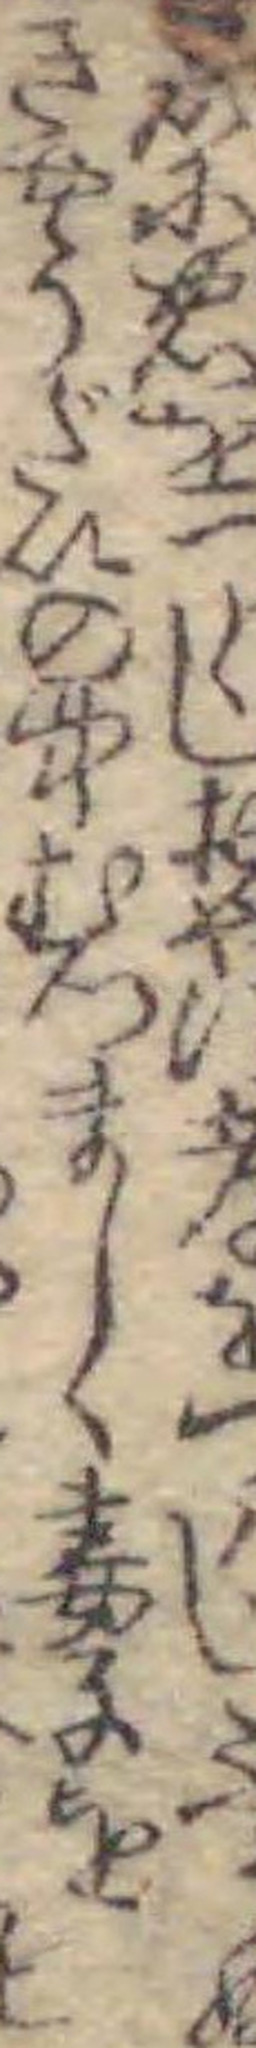きやうだいの中むつましく妻子を
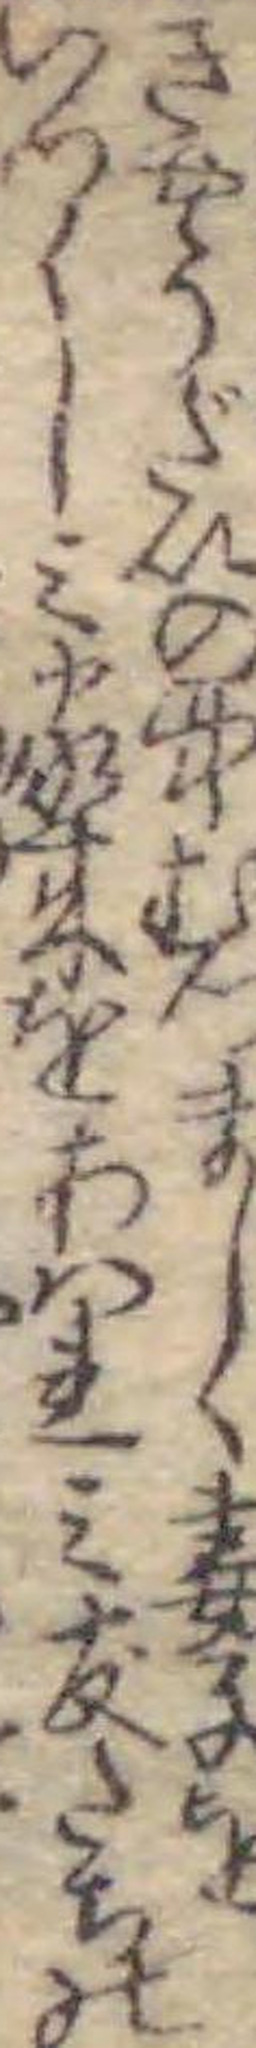いつくしみ家来をあはれみ友たちの
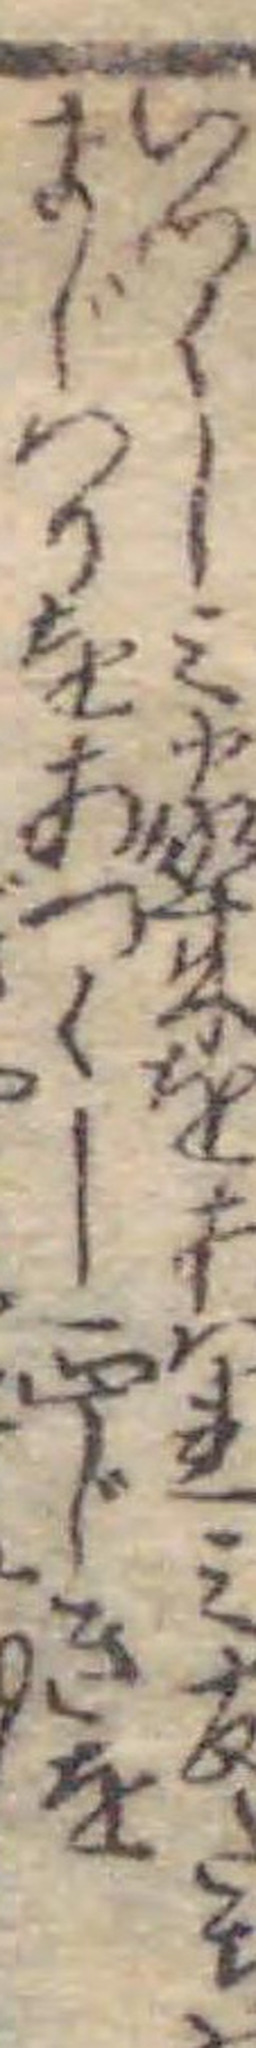まじはりをあつくし正じきを
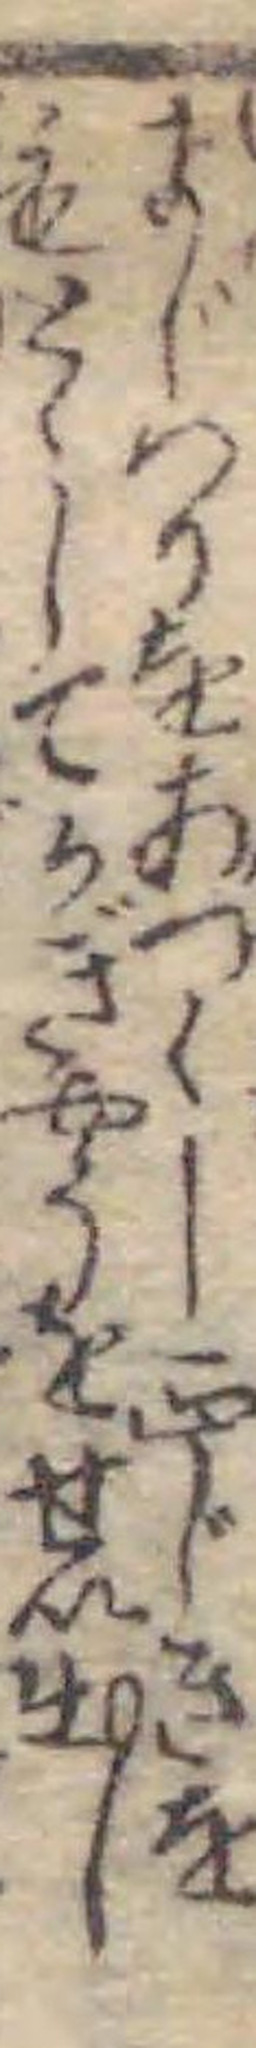もとゝしてかぎやうをせい出し
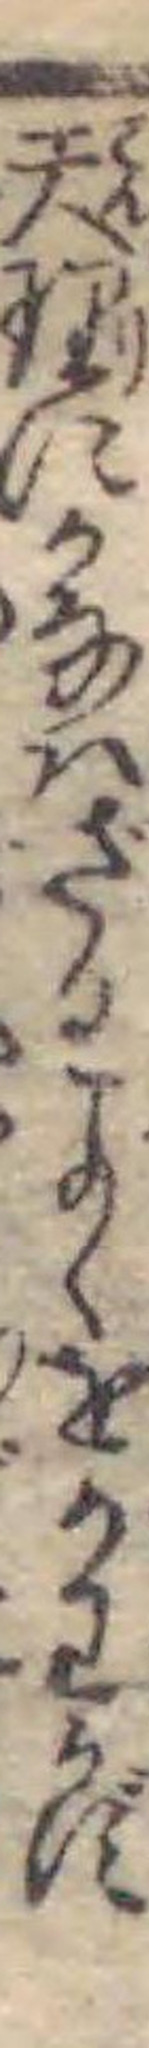天理にかなはざるよくをかわかず
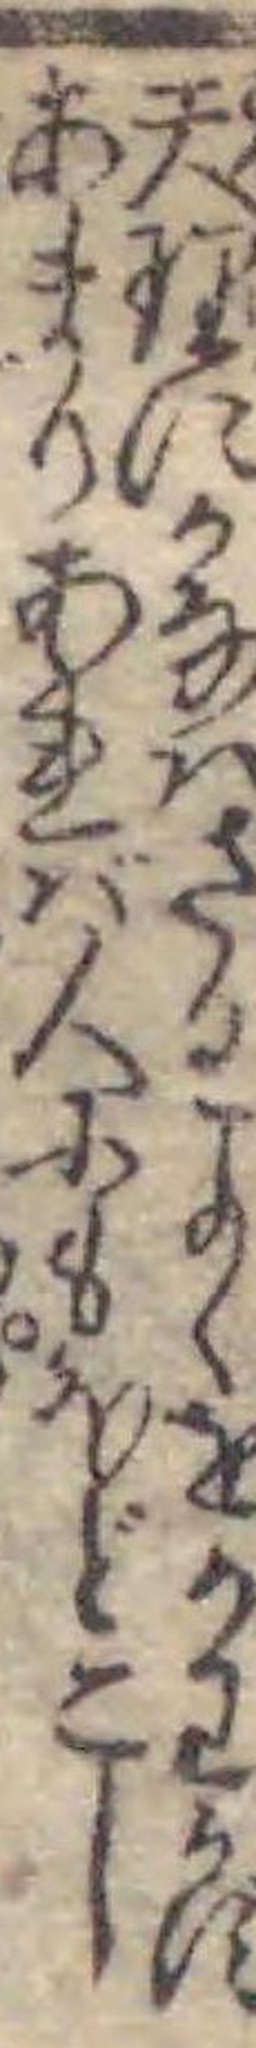あまりあれば人にもほどこし
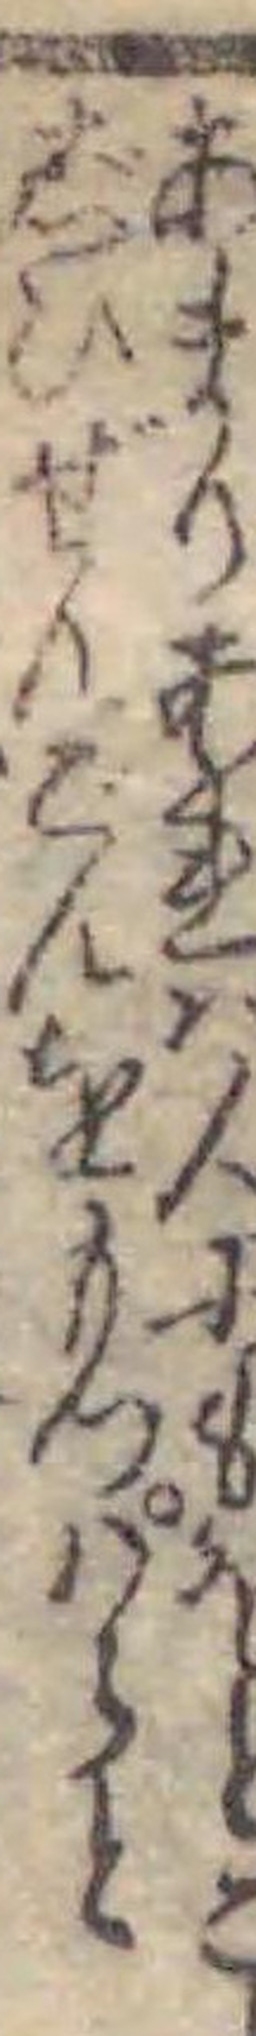じひぜんごんをもつぱらと
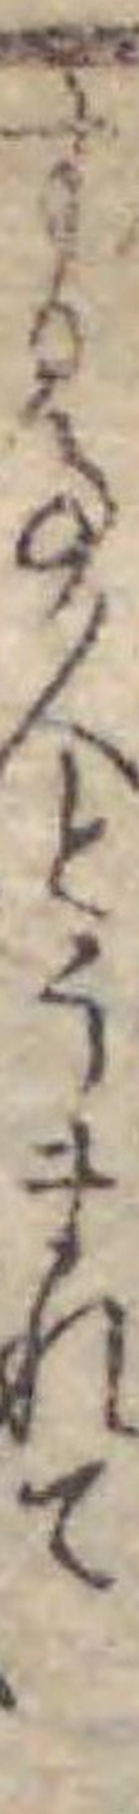する事人とうまれて
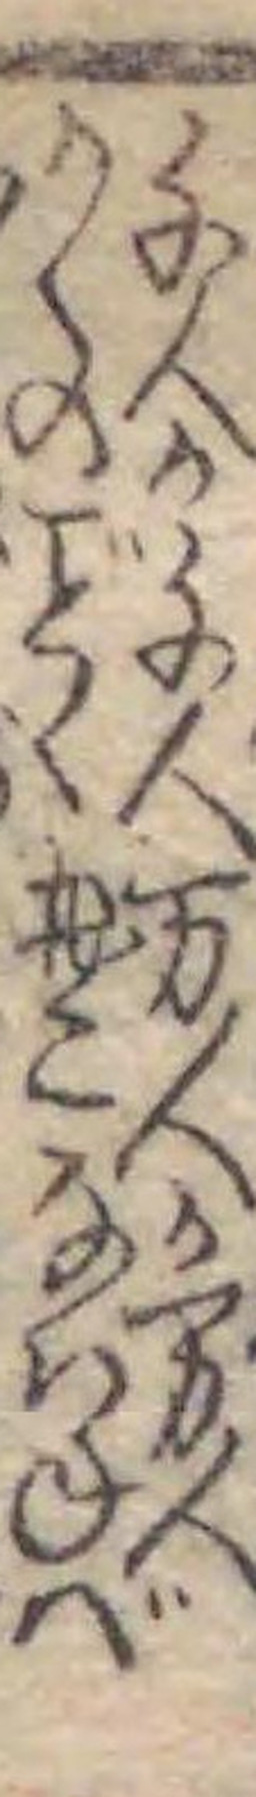かくのごとくおこなはねは
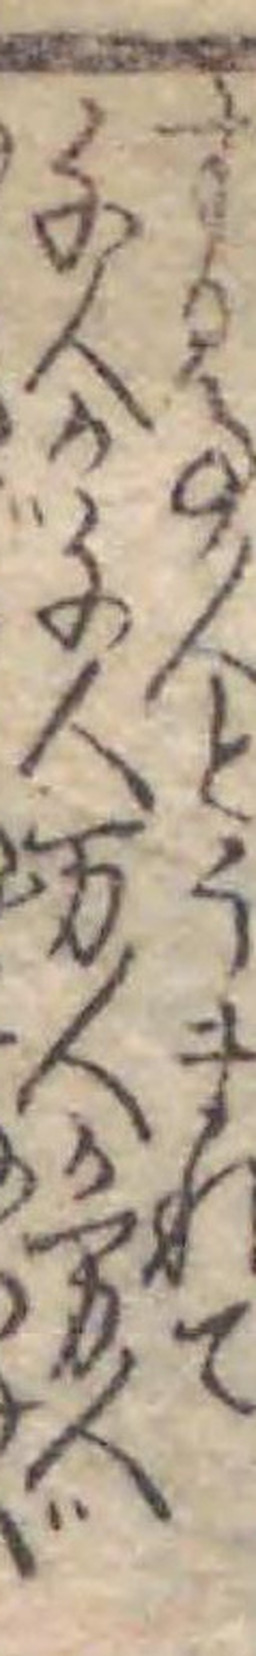千人か千人万人か万人
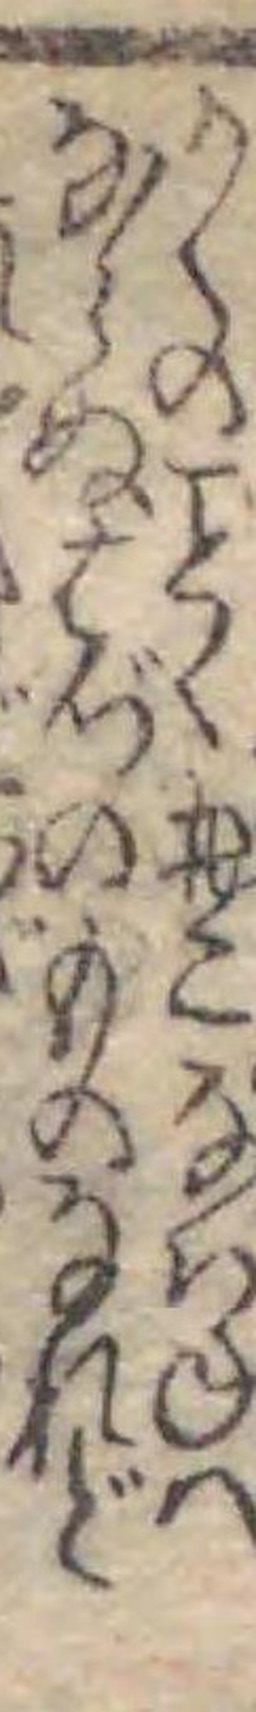ならぬはづのものなれど
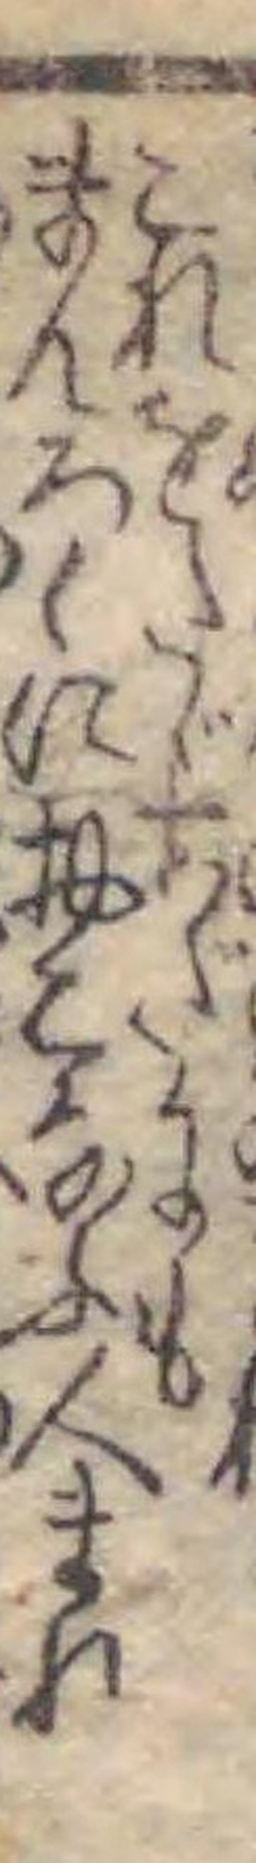まんそくにおこなふ人まれ
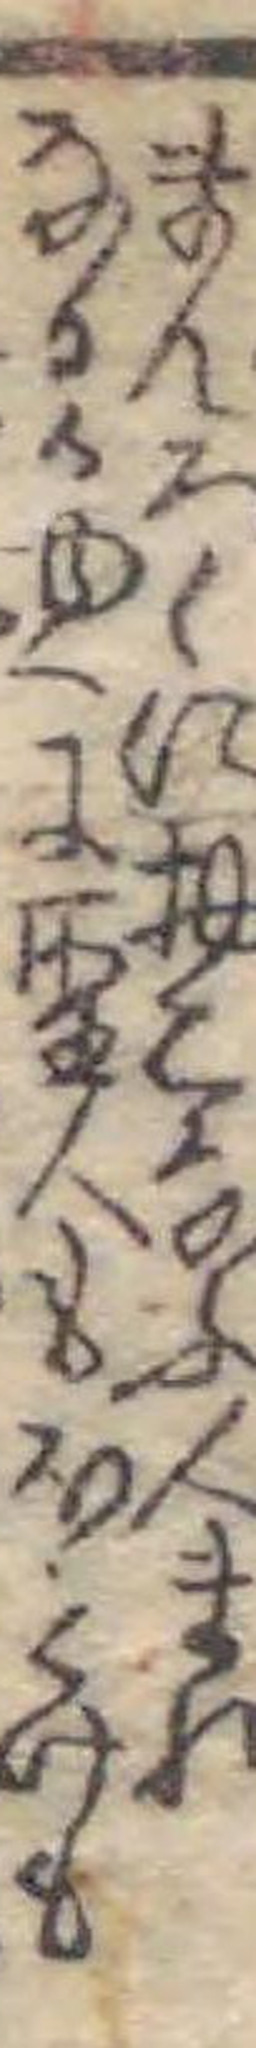なるかゆへに聖人もほとけも
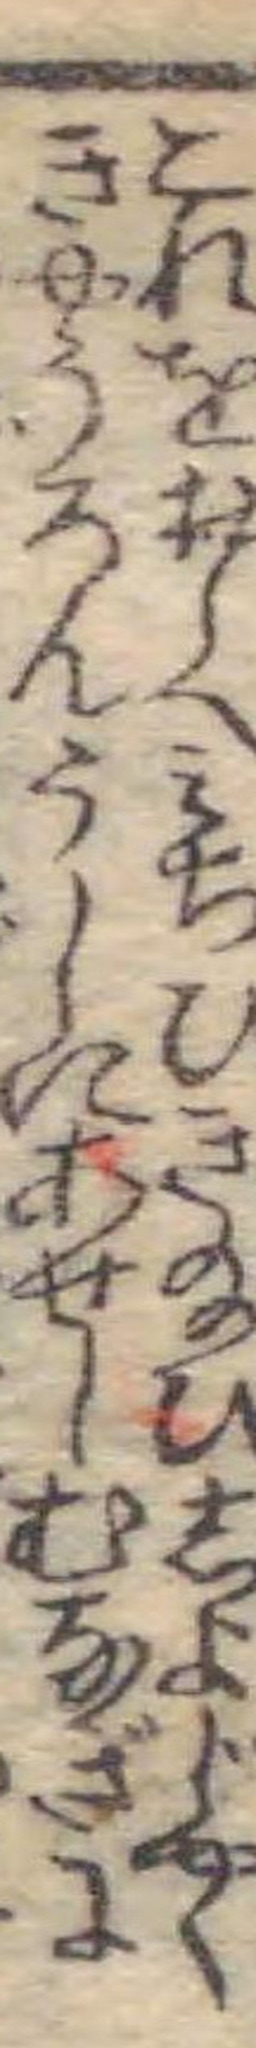きやうろんうしにあせしむなぎに
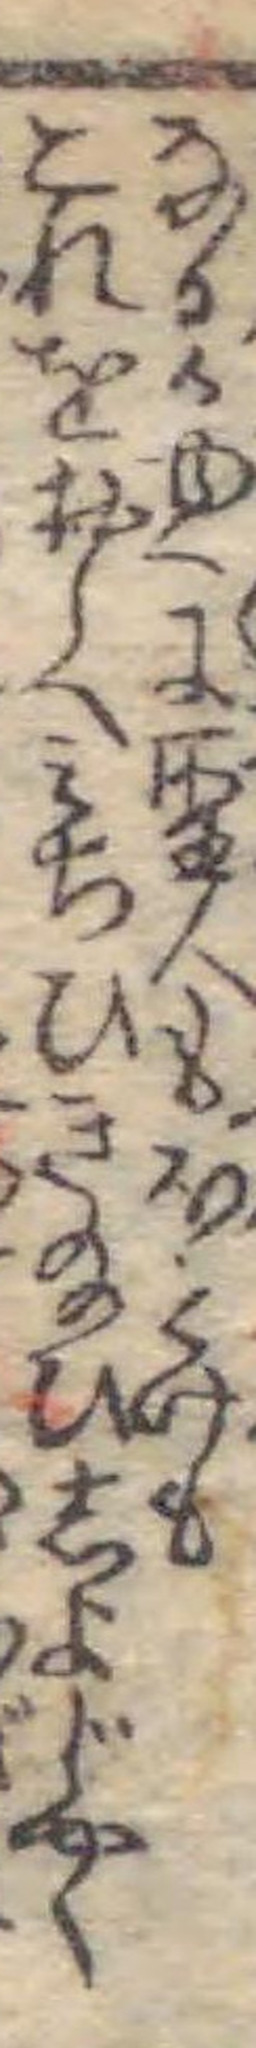これをおしへみちひき給ひしよじやく
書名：人心鏡写絵 : 3巻
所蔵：国立国会図書館 National Diet Library, JAPAN
